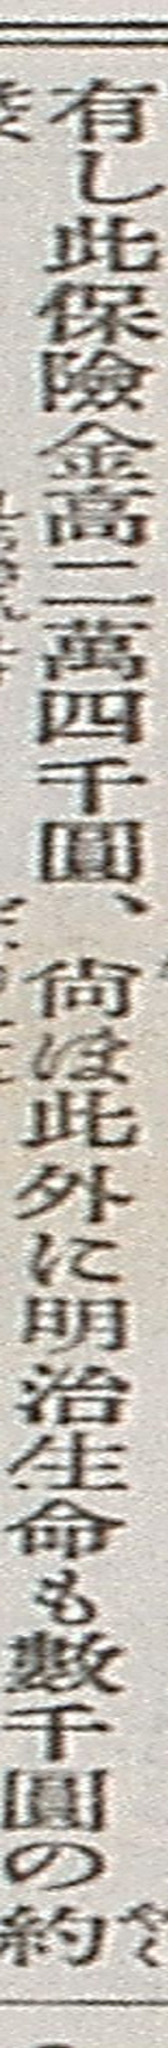有し此保険金高二万四千円、尚ほ此外に明治生命も数千円の約
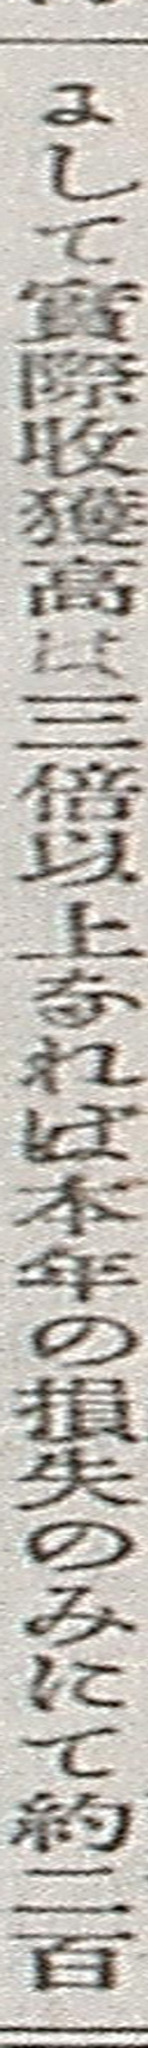にして実際収穫高は三倍以上なれば本年の損失のみにて約ニ百
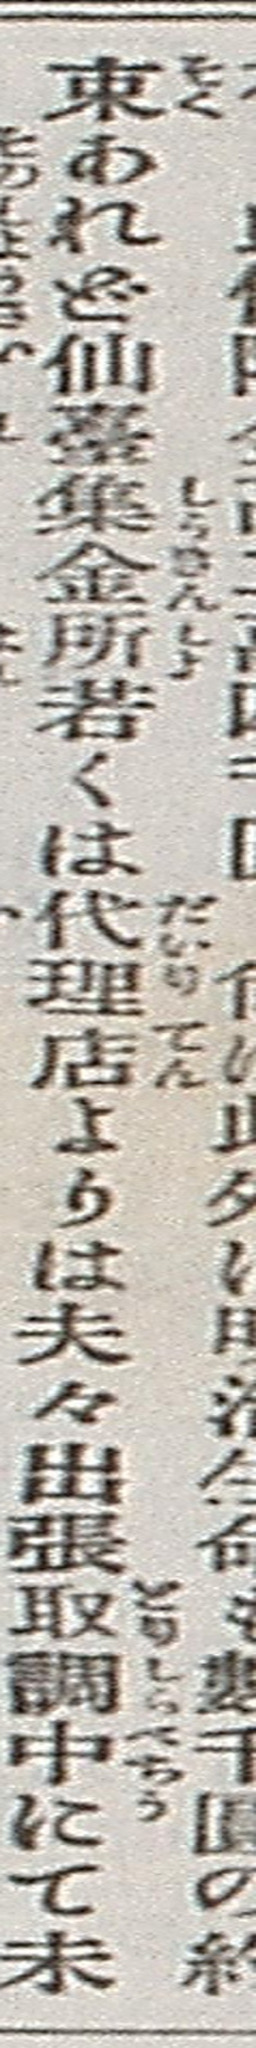束あれど仙台集金所若くは代理店よりは夫々出張取調中にて未
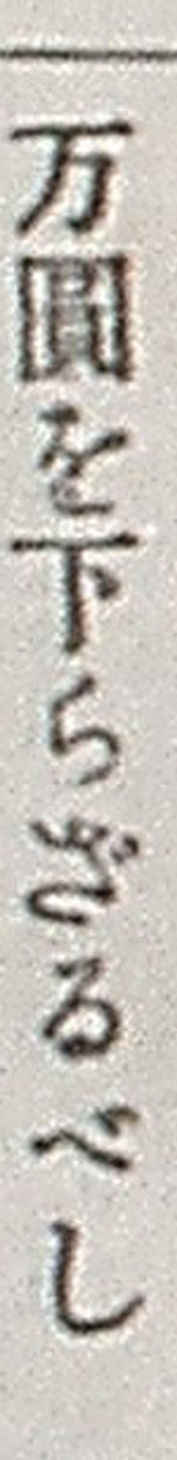万円を下らざるべし
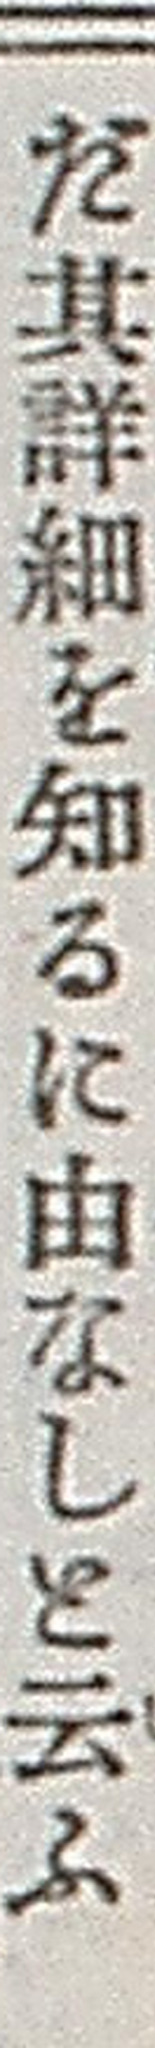だ其詳細を知る由なしと云ふ
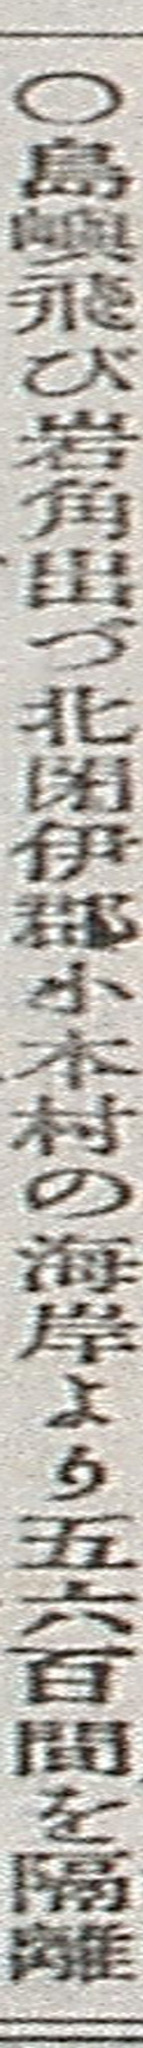○島嶼飛び岩角出づ北閉伊郡小本村の海岸より五六百間を隔離
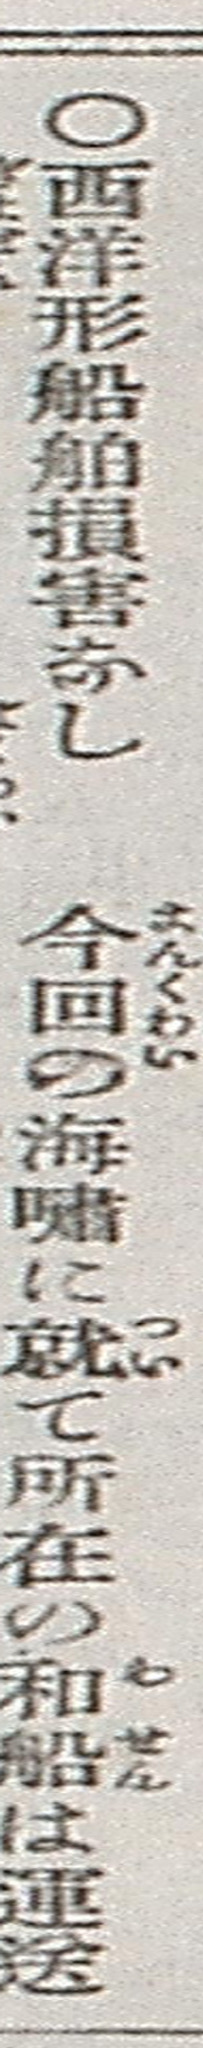○西洋形船舶損害なし今回の海嘯に就て所在の和船は運送
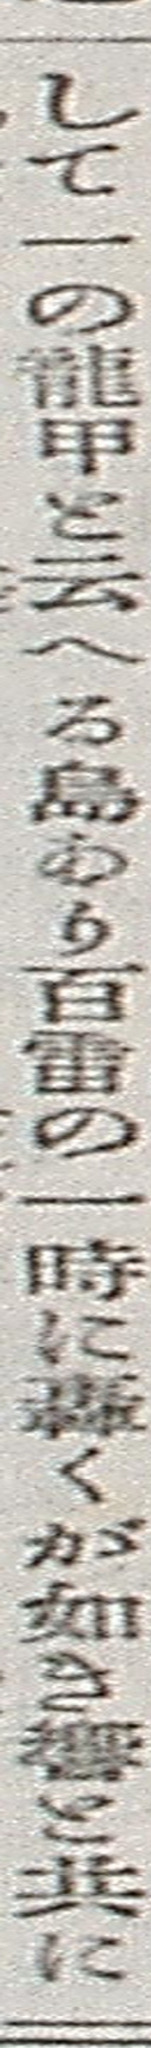して一の龍甲と云へる島あり百雷の一時に轟くが如き響と共に
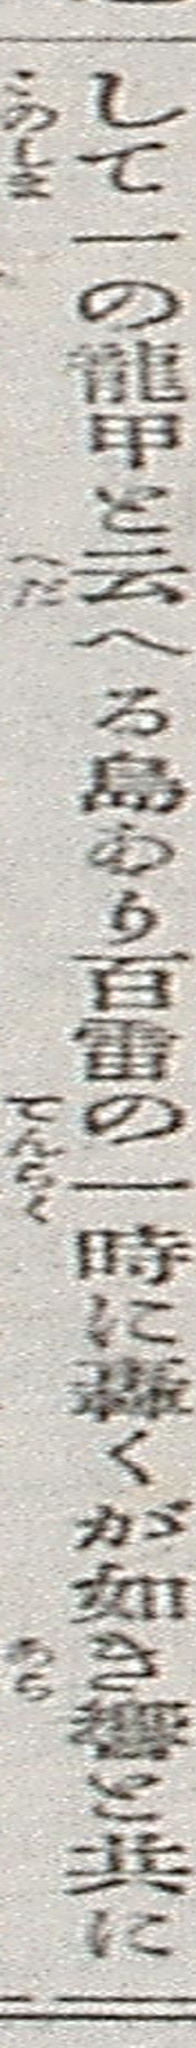して一の龍甲と云へる島あり百雷の一時に轟くが如き響と共に
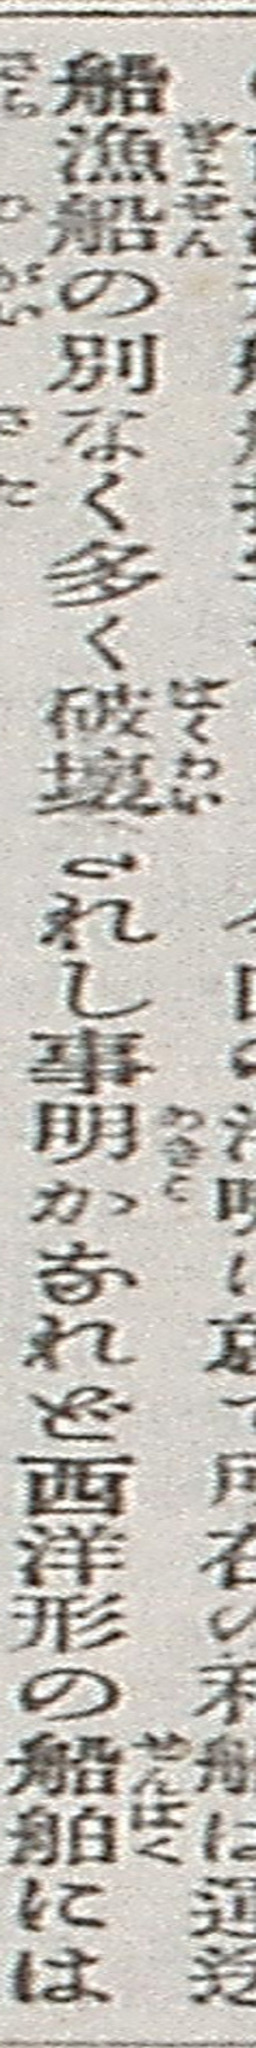船漁船の別なく多く破壊されし事明かなれど西洋形の船舶には
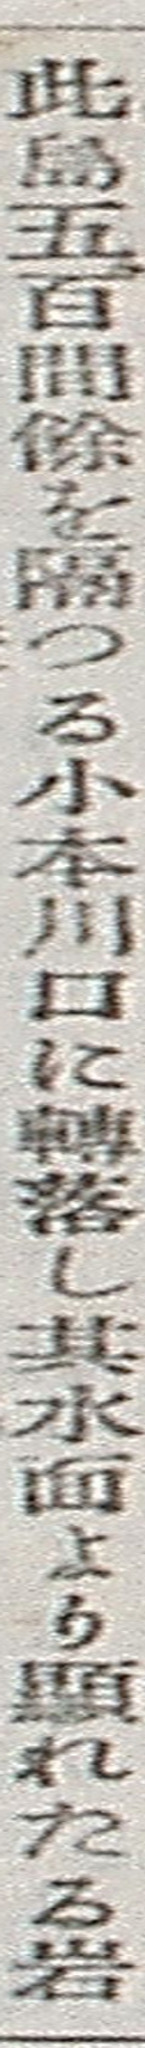此島五百間余を隔つる小本川口に転落し其水面より顕れたる岩
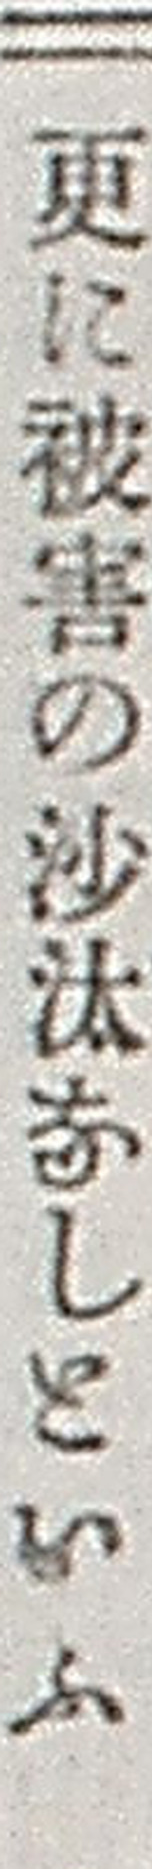更に被害の沙汰なしといふ
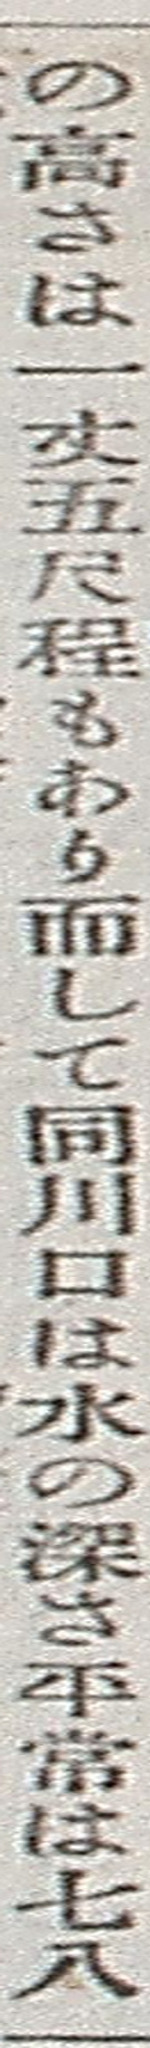の高さは一丈五尺程もあり而して同川口は水の深さ平常は七八
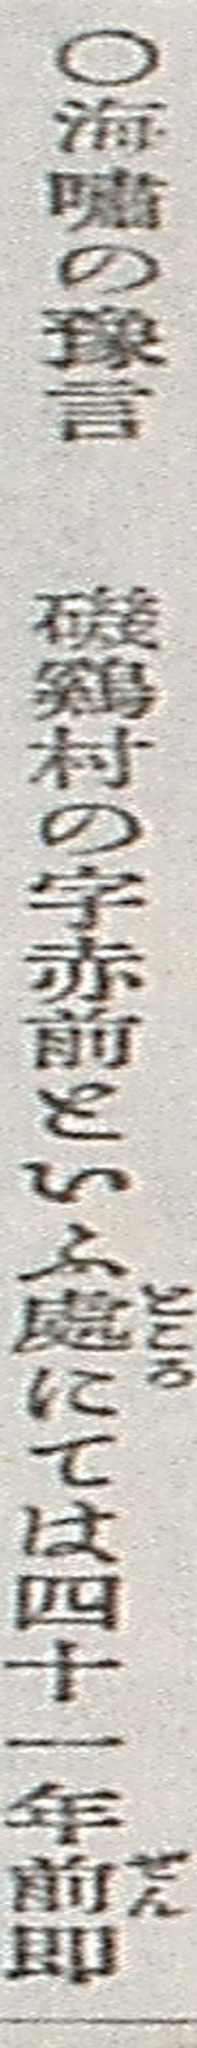○海嘯の予言磯鶏村の字赤前といふ処にては四十一年前即
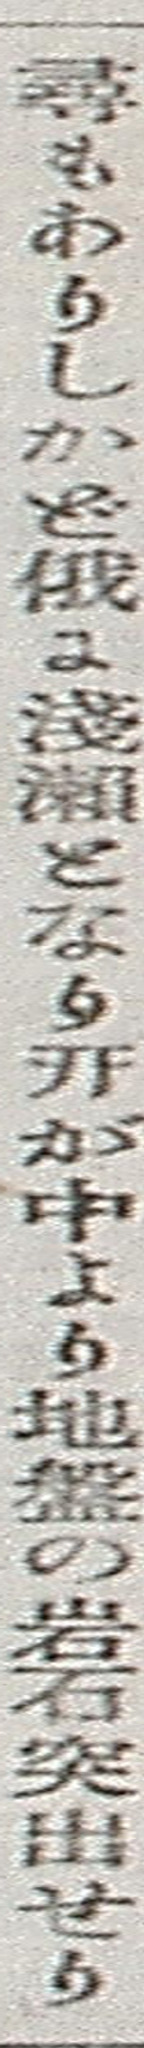尋もありしかど俄に浅瀬となり幵が中より地盤の岩石突出せり

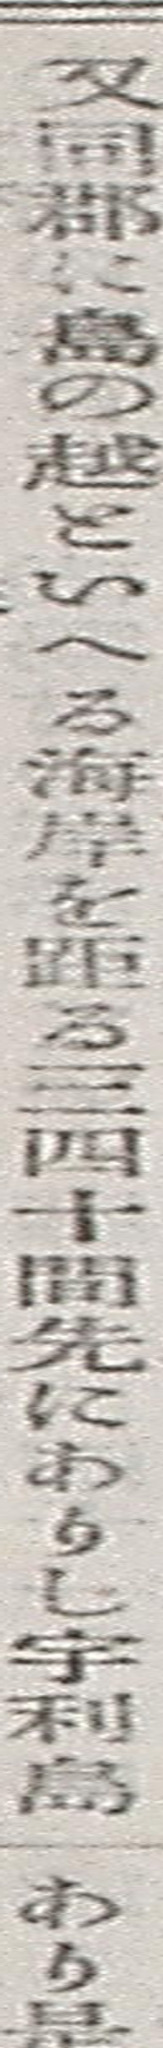又同郡に島の越といへる海岸を距る三四十間先にありし宇利島
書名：風俗畫報臨時増刊第百二十號　大海嘯被害録（下）
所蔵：東京大学地震研究所図書室 Earthquake Research Institute Library, The University of Tokyo, JAPAN
